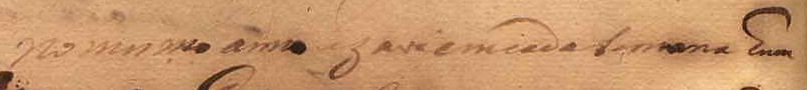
no mesmo anno Rezava em cada somana hum
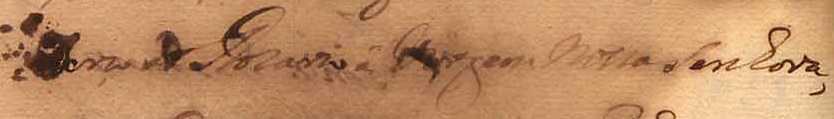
terço do Rozario à Virgem Nossa Senhora,
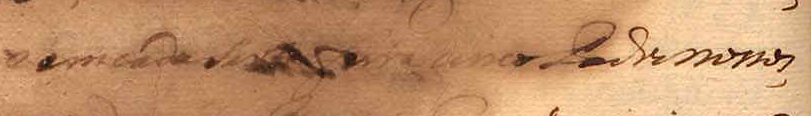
e em cada sexta feira cinco Padre nossos,
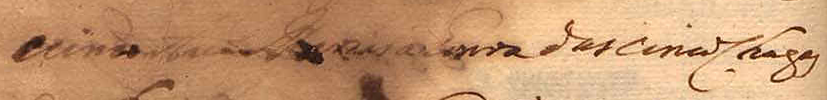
e cinco Aue Marias á honra das cinco Chagas
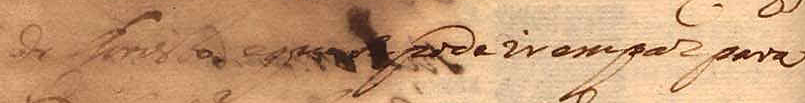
de Christo e que se pode ir em paz para
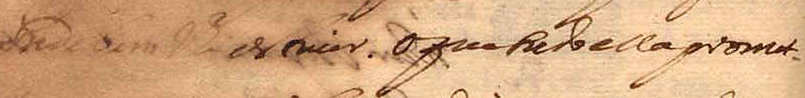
onde bem lhe estiuer. o que tudo ella promet
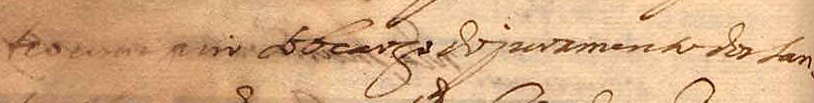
teo cumprir sob cargo do juramento dos San
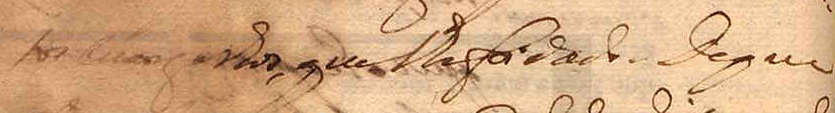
tos euangelhos, que lhe foi dado. De que
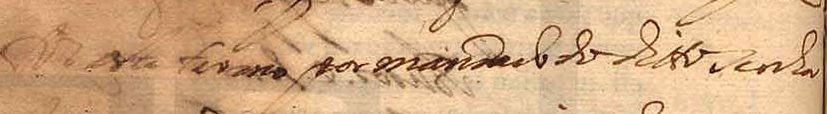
fez este termo por mandado do ditto senhor
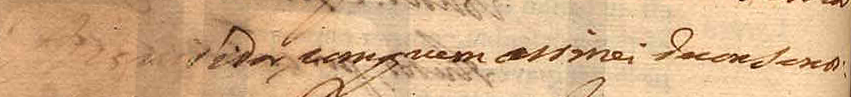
Inquisidor, com quem assinei de consenti
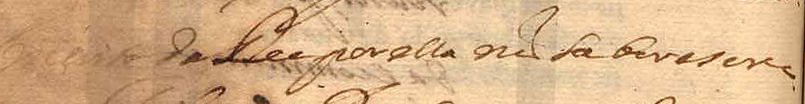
mento da Ree por ella naõ saber escre
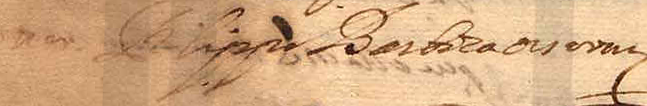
uer. Filippe Barboza o escreui
